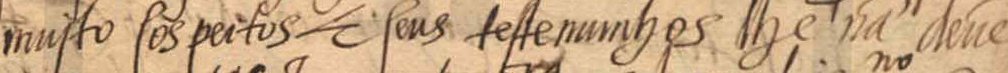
mujto sospeitos E seus testemunhos lhe na̅ deuē
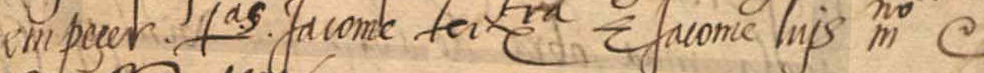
empeçer. t.as Jacome teixra E Jacome lujs mno e
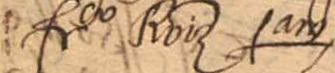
frco Roiz̄ tam /
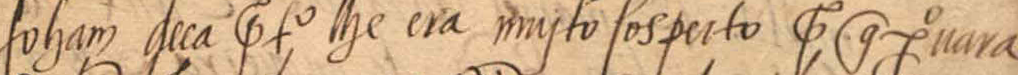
Joham deça p̄o to lhe era mujto sospeito p̄o q̅ ꝓouara
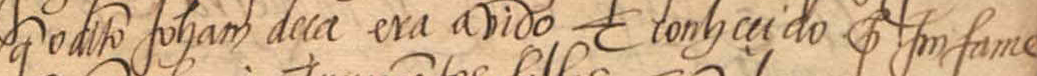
q̅ o di̅to Joham deça era avido E conheçido p̄o Jmfame
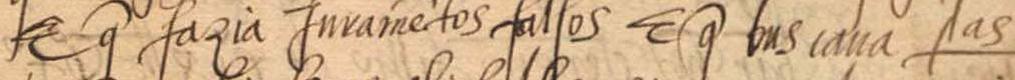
E q̅ fazia Jurame̅tos falsos E q̅ buscaua tas
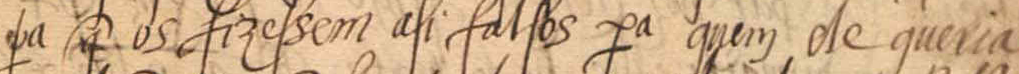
ꝑa q̅ os fizessem asi falsos ꝑa quem ele queria
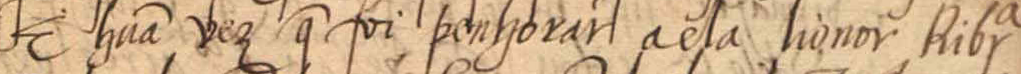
E hu̅a vez q̅ foi penhorar a ela lionor Ribra
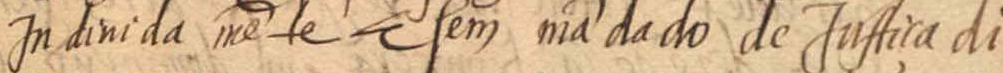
Jndiuidamēte E sem ma̅dado de Justiça di
